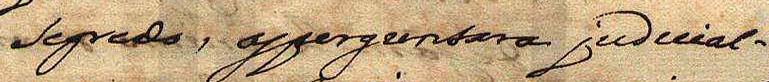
segredo, as perguntara judicial
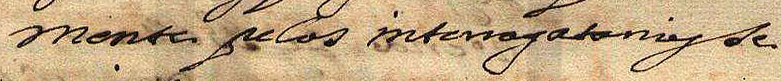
mente pelos interrogatorios se
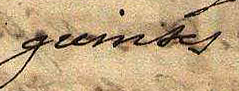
guintes
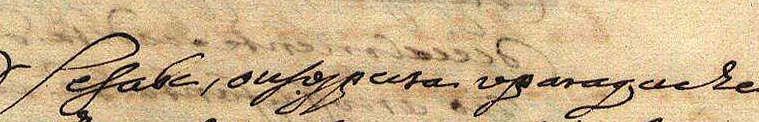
Se sabe, ou sospeita o para que he
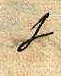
1
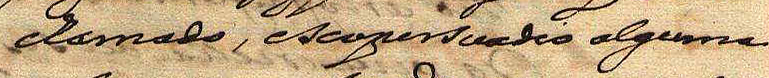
chamado, e se o persuadio alguma
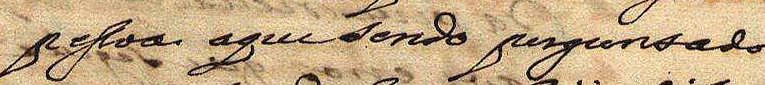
pessoa a que sendo perguntado
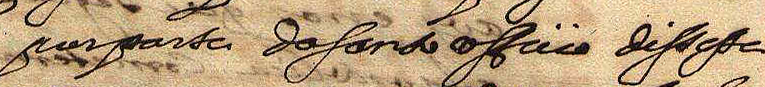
por parte do Santo officio dissesse
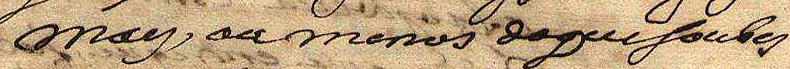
mais, ou menos do que soubes
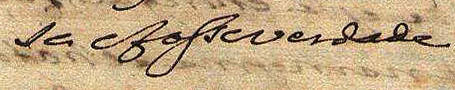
se e fosse verdade
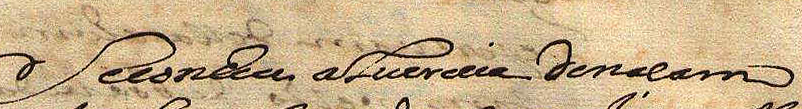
Se conhece a Lucrecia de naçam
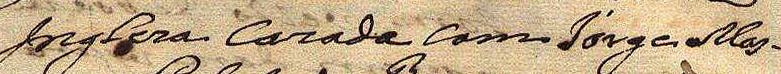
Jngleza cazada com Iorge Mas
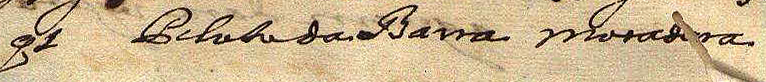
qs Piloto da Barra moradora
